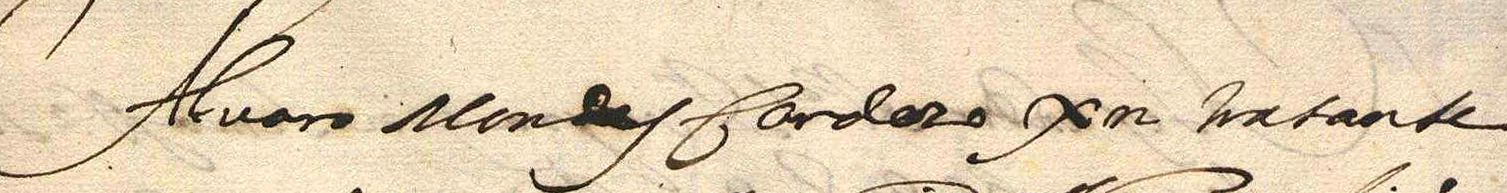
Aluaro Mendes Cardozo x n tratante
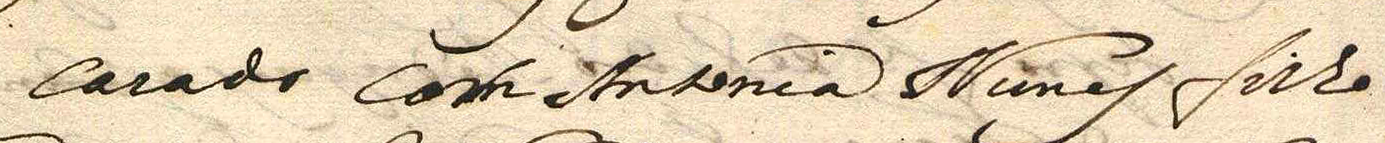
cazado com Antonia Nunes filho
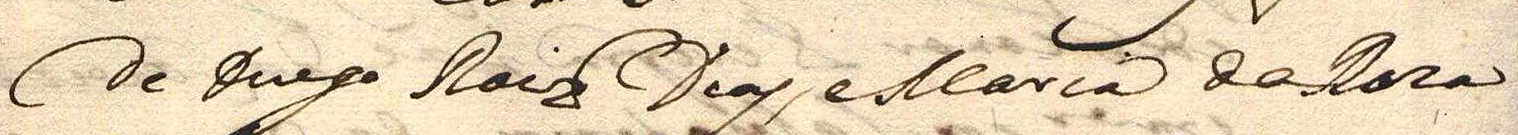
de Diogo Roiz̄ Dias, e Maria da Roza
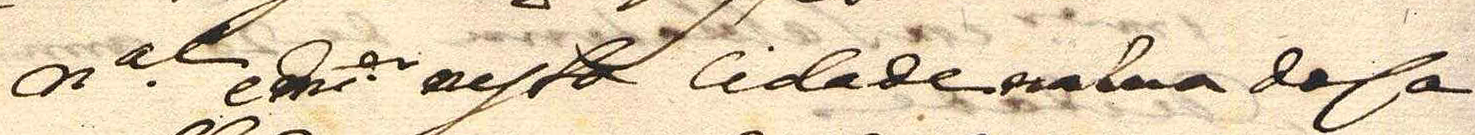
n.al e mr.or nesta cidade na Rua do Ca
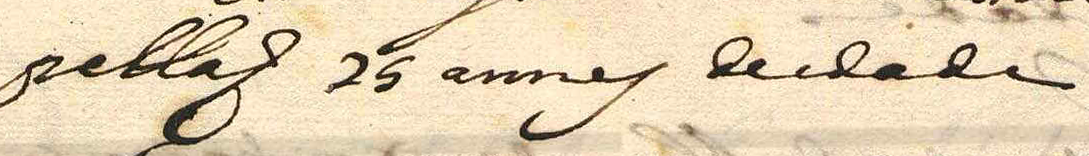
pellaõ 25 annos de idade
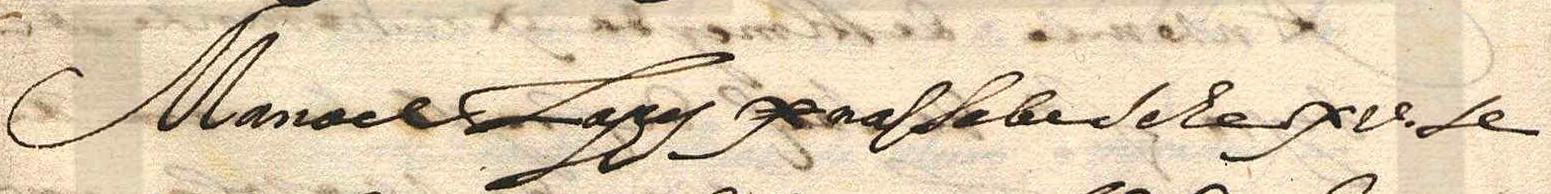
Manoel Lopes x naõ Sabe se he x v. se
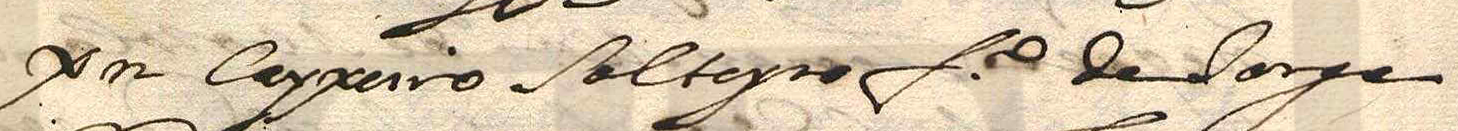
x n Cayxeiro solteyro f.o de Iorge
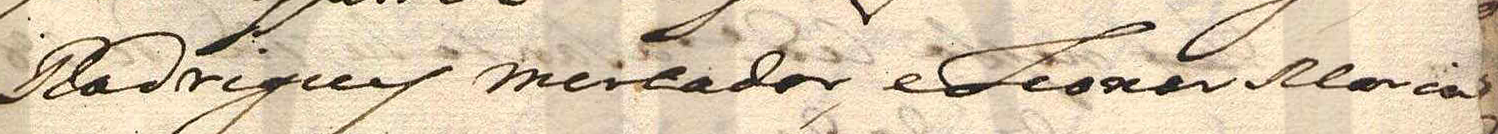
Rodrigues mercador, e Leonor Maria
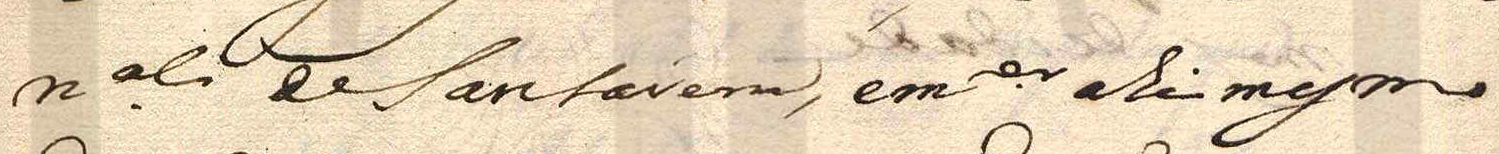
n.al de Santarem, e m.or ahi mesmo
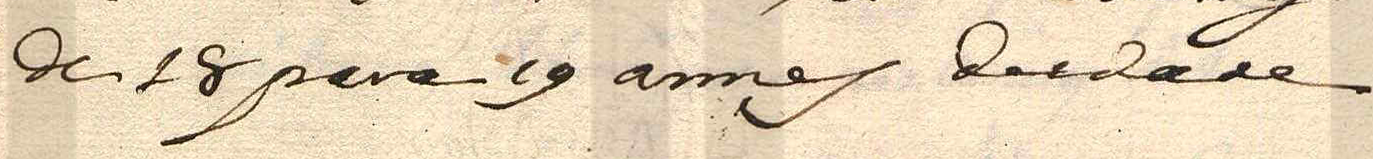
de 18 para 19 annos de idade
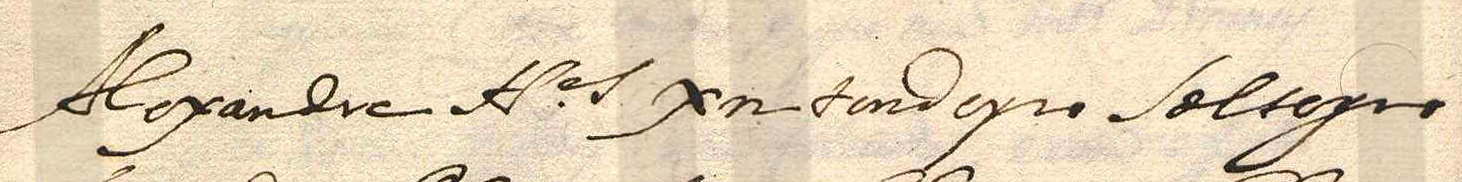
Alexandre H.es x n tendeyro solteyro
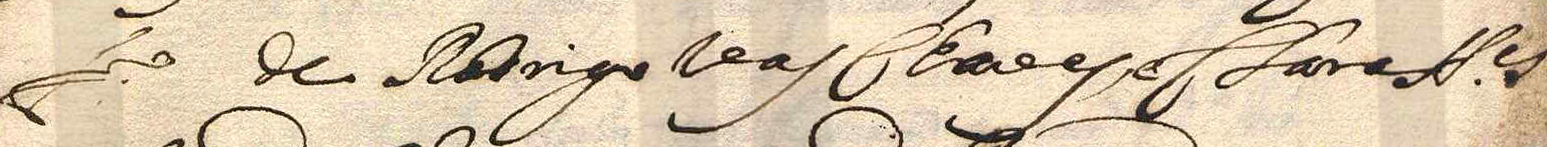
f.o de Rodrigo Vas Chaves, e Clara H.es
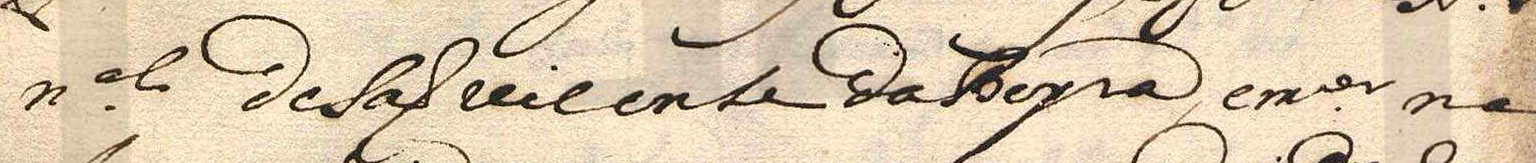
n.al de Saõ uicente da Beyra, e m.or na
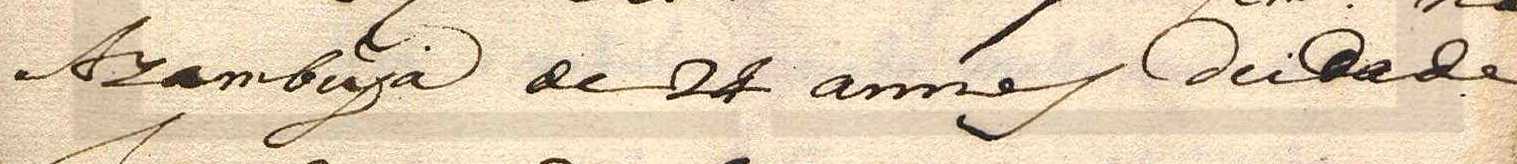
Azambuja de 24 annos de idade
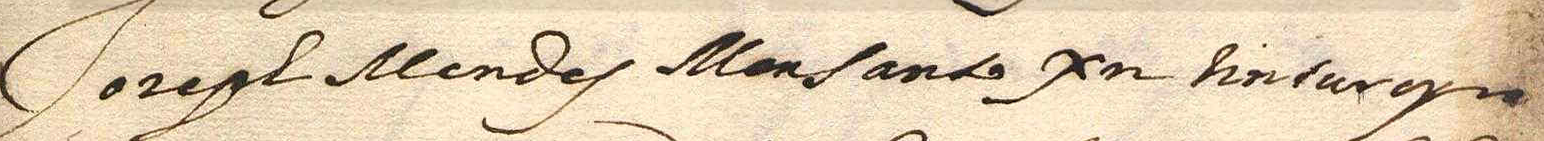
Jozeph Mendes Monsanto x n tintureyro
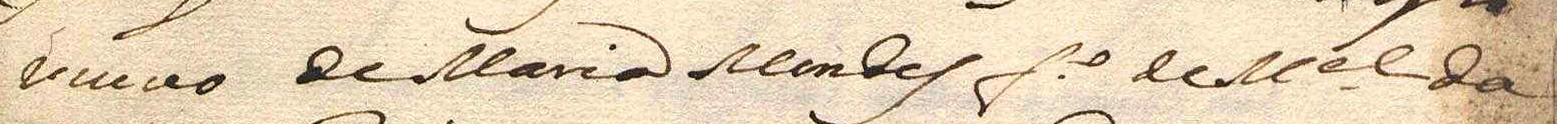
viuuo de Maria Mendes f.o de Mel da
